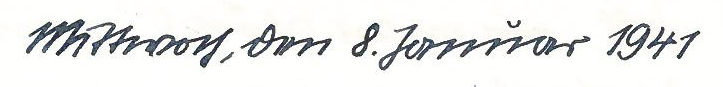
Mittwoch, den 8. Januar 1941
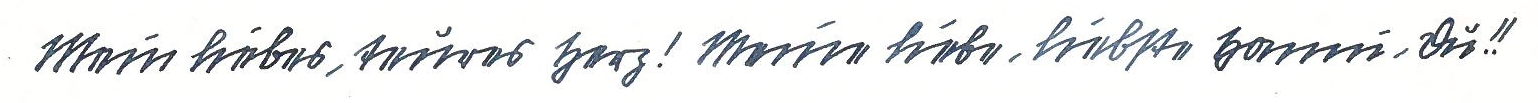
Mein liebes, teures Herz! Meine liebe, liebste Du!!
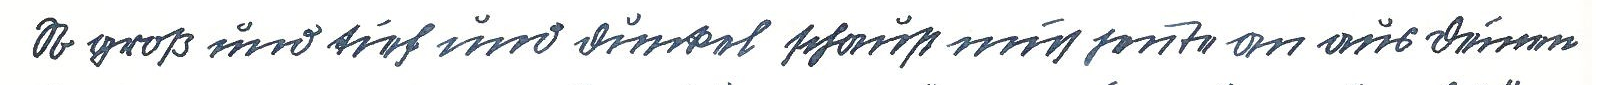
So groß und tief und dunkel schaust mich heute an aus Deinen
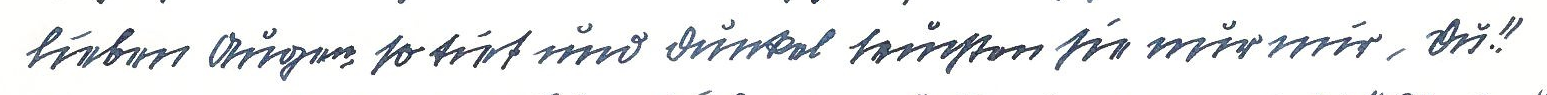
lieben Augen, so tief und dunkel leuchten sie nur mir, Du!!
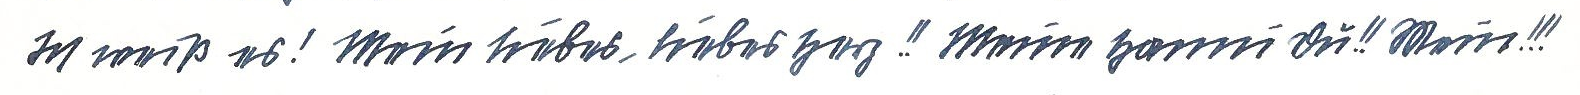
Ich weiß es! Mein liebes, liebes Herz!! Meine Du!! Mein!!!
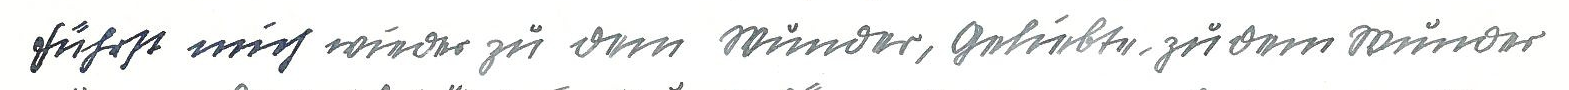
Führst mich wieder zu dem Wunder, Geliebte, zu dem Wunder
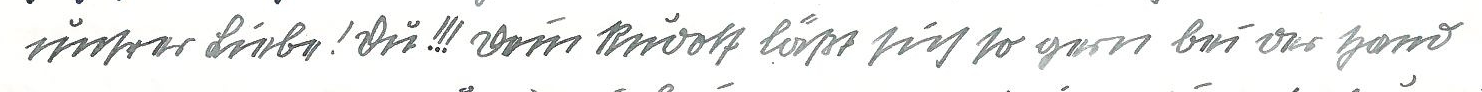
unsrer Liebe! Du!!! Dein läßt sich so gern bei der Hand
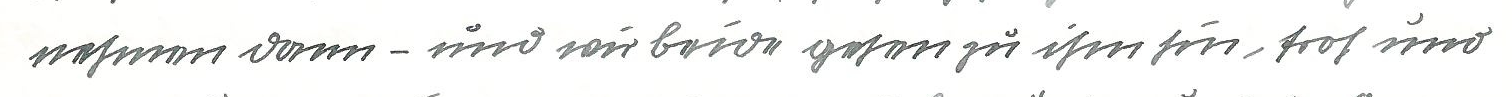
nehmen dann – und wir beide gehen zu ihm hin, froh und
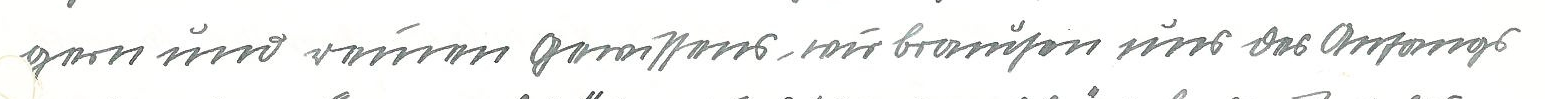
gern und reinen Gewissens, wir brauchen uns des Anfangs
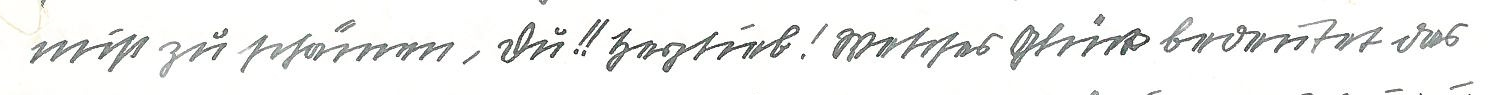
nicht zu schämen, Du!! Herzlieb! Welches Glück bedeutet das
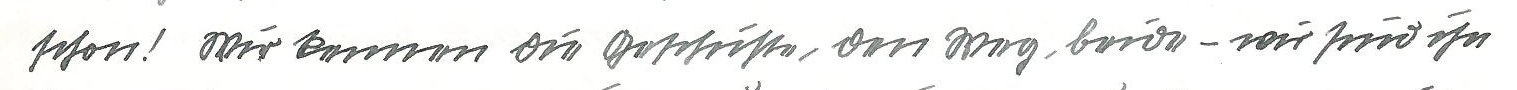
schon! Wir kennen die Geschichte, den Weg, beide – wir sind ihn
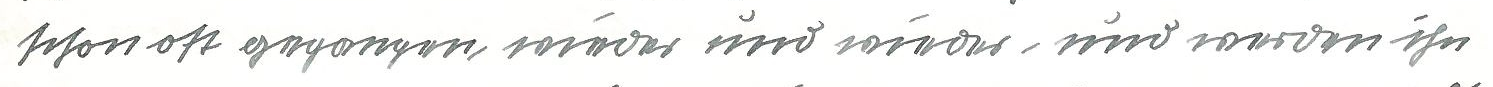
schon oft gegangen, wieder und wieder, und werden ihn
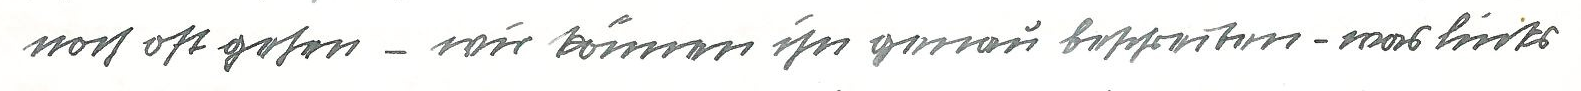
noch oft gehen – wir können ihn genau beschreiben – was rechts
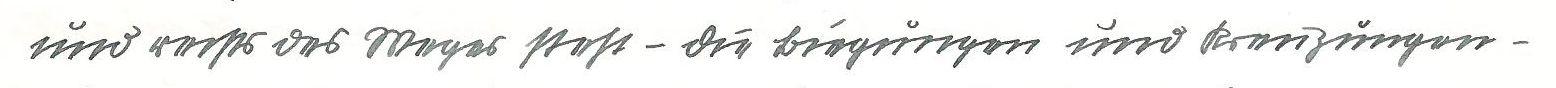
und links des Weges steht – die Biegungen und Kreuzungen –
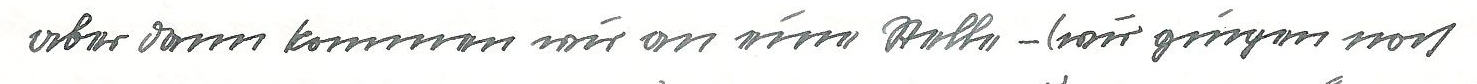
aber dann kommen wir an eine Stelle – (wir gingen noch
